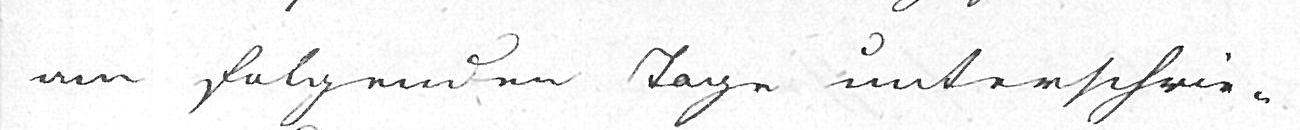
am folgenden Tage unterschrie-
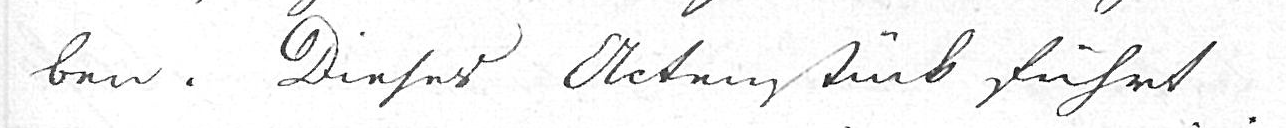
ben. Dieses Actenstück führt
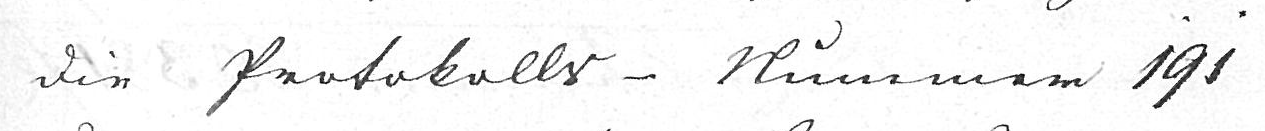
die Protokolls-Nummer 191
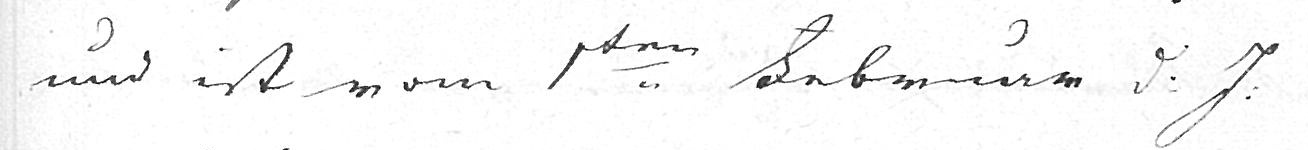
und ist vom 1ten Februar d: J:
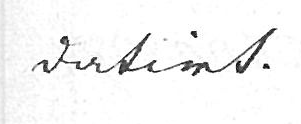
datirt.
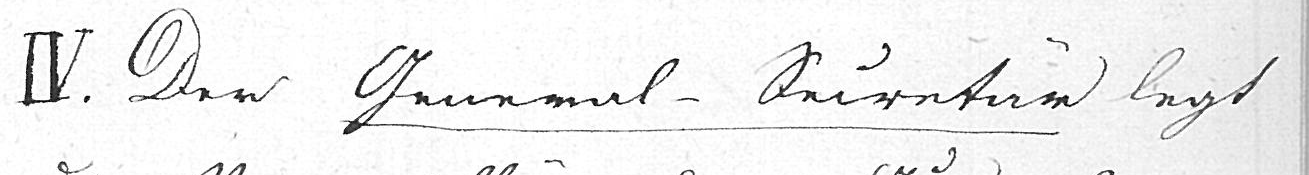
IV. Der General-Secretär legt
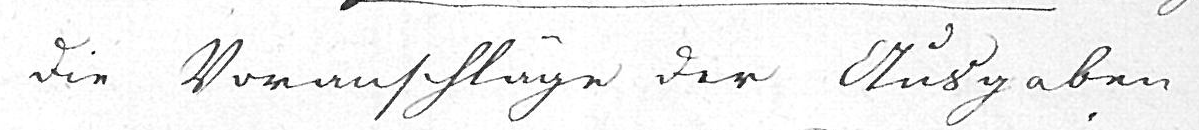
die Voranschläge der Ausgaben
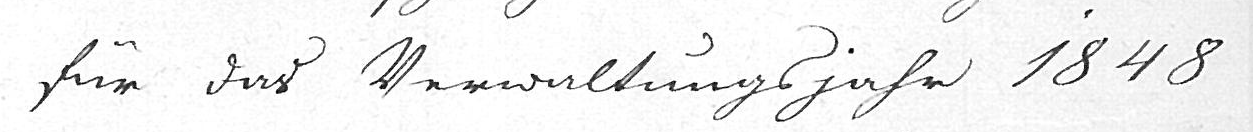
für das Verwaltungsjahr 1848
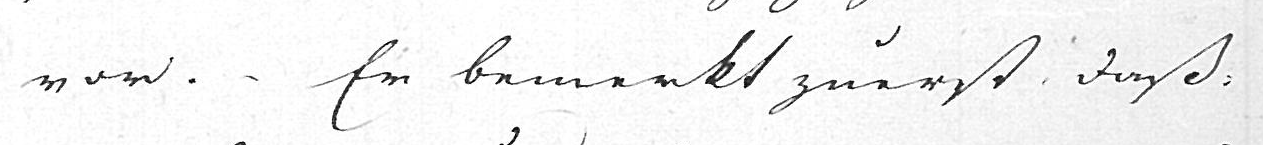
vor. Er bemerkt zuerst, daß
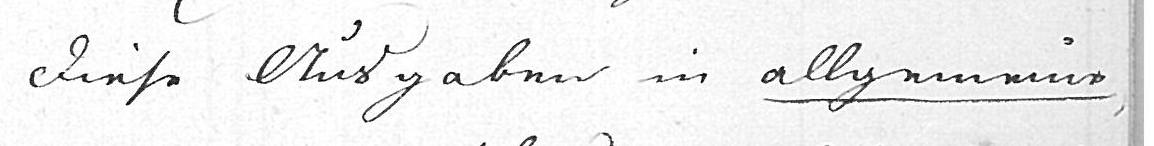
diese Ausgaben in allgemeine,
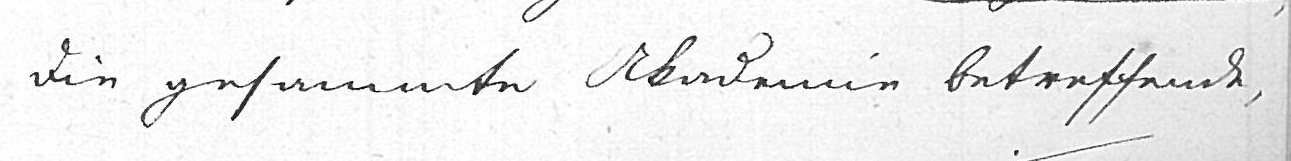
die gesammte Akademie betreffende,
